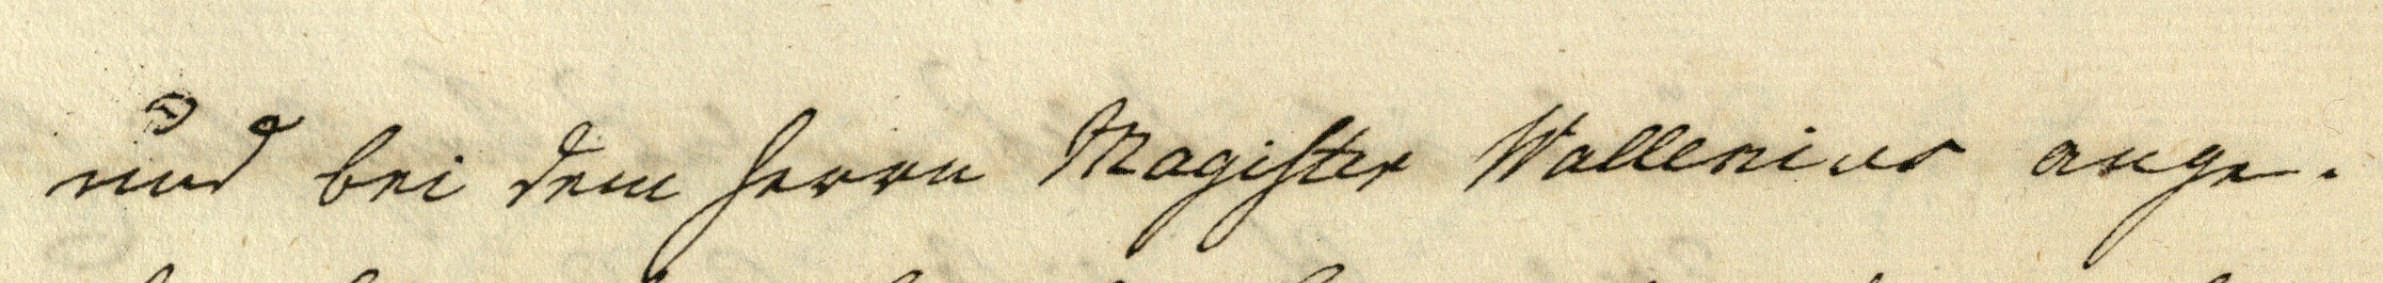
und bei dem Herrn Magister Wallenius ange-
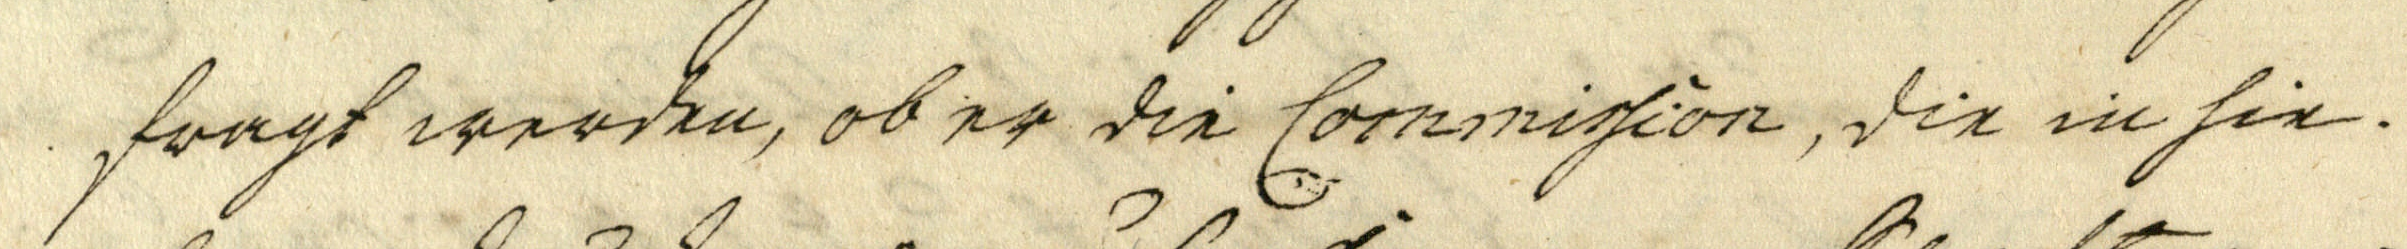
fragt werden, ob er die Commission, die in hie-
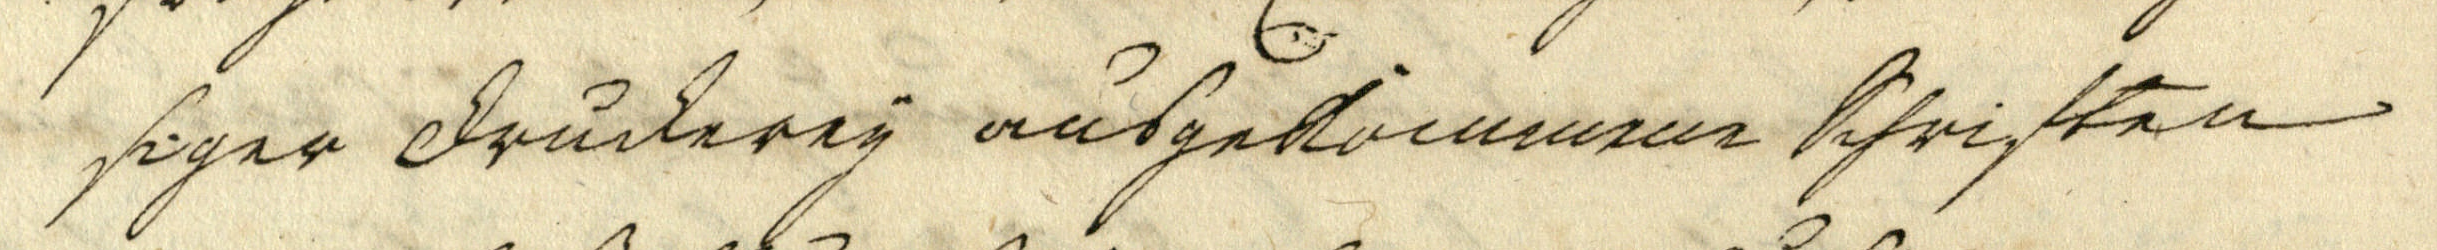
siger Druckerey ausgekommenen Schriften
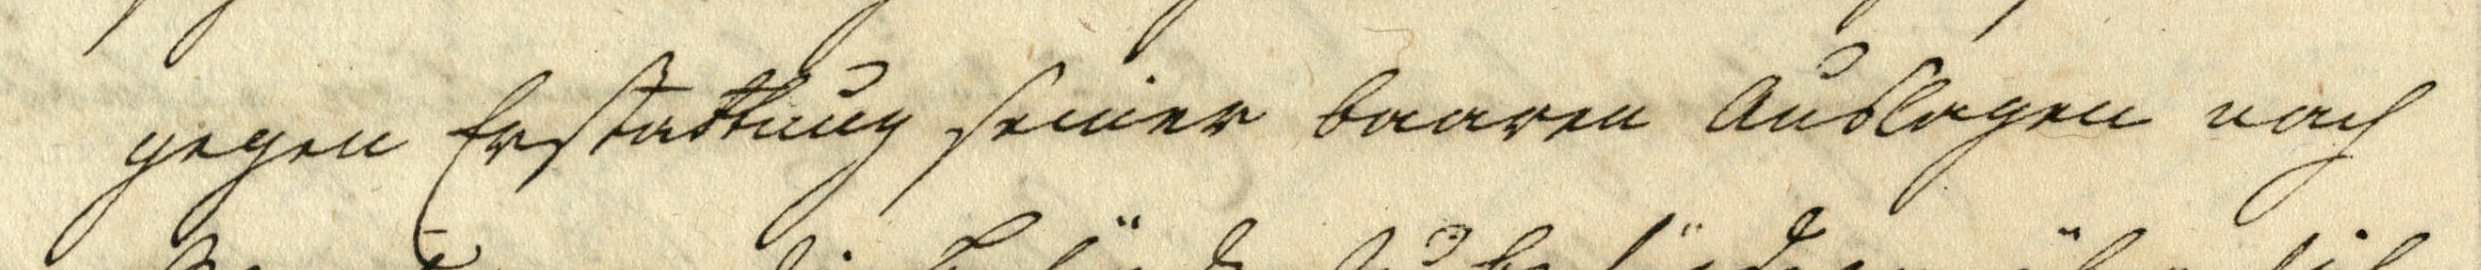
gegen Erstattung seiner baaren Auslagen nach
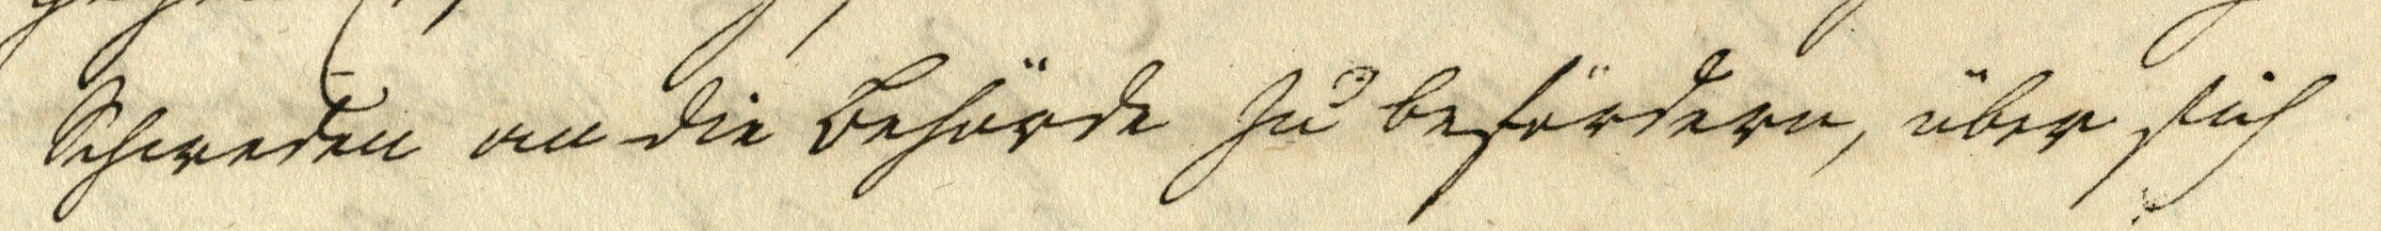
Schweden an die Behörde zu befördern, über sich
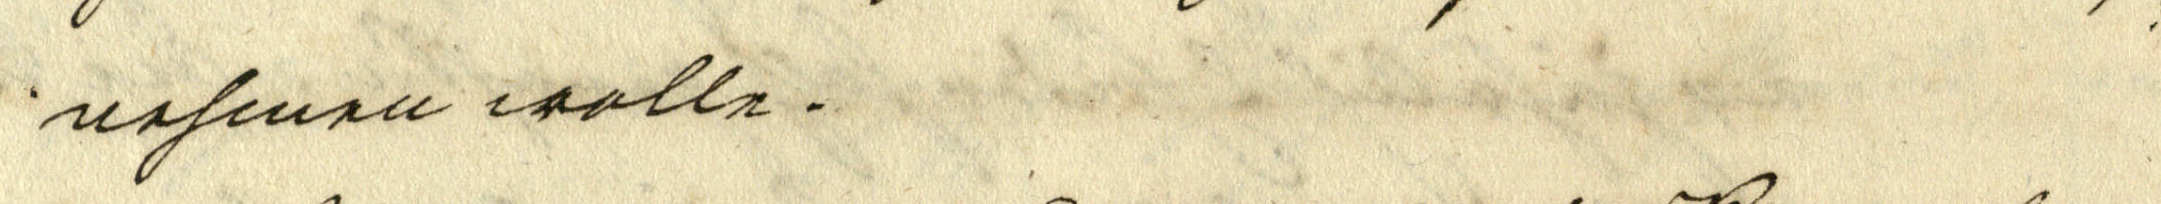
nehmen wolle.
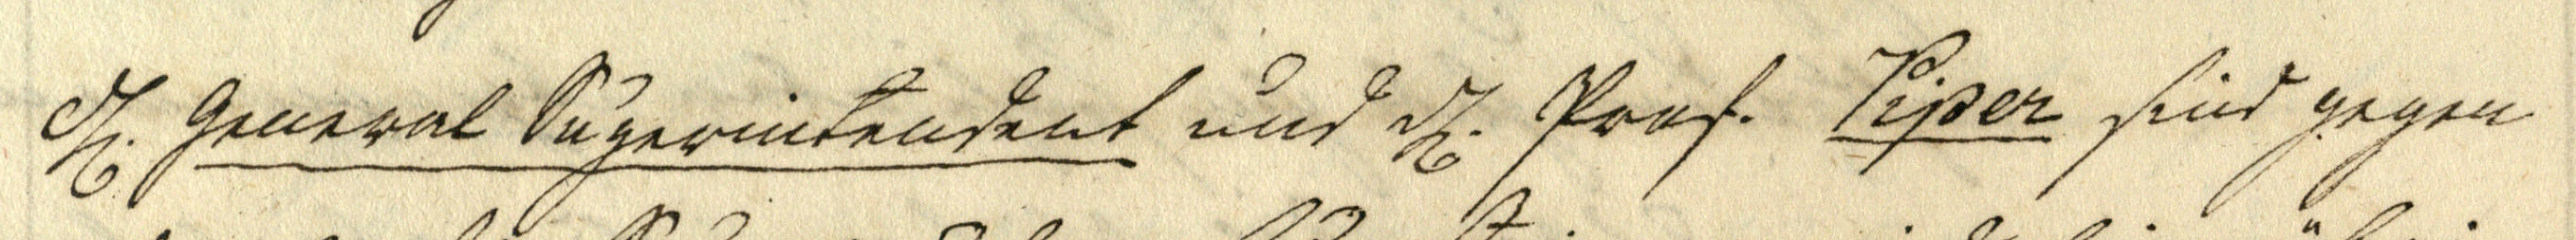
dh. General Superintendent und dh. Prof. Piper sind gegen
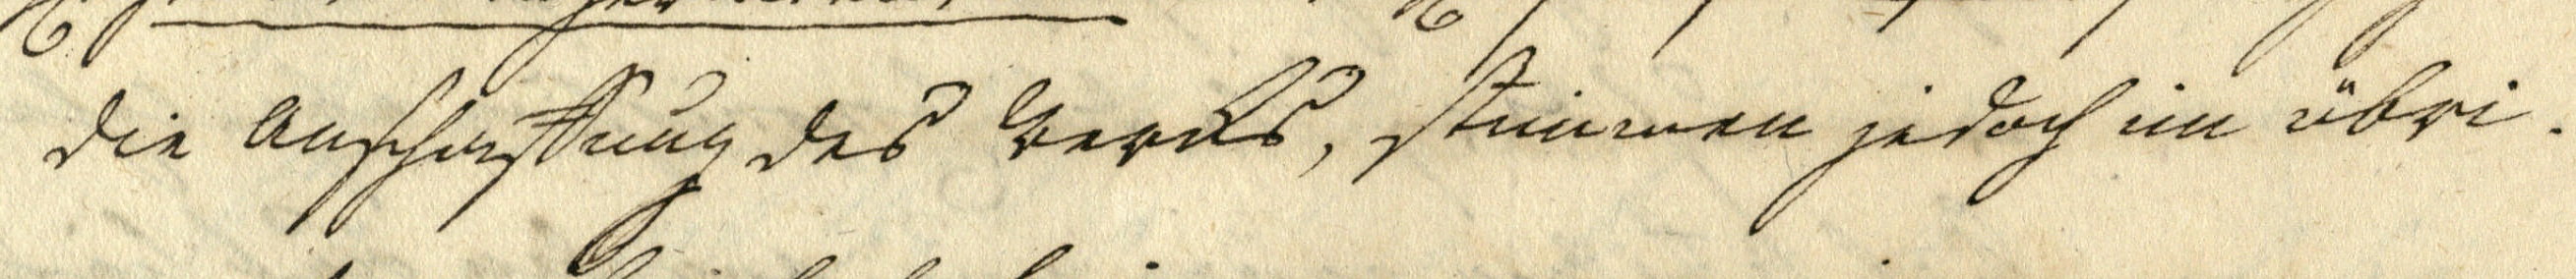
die Anschaffung des Werks, stimmen jedoch im übri-
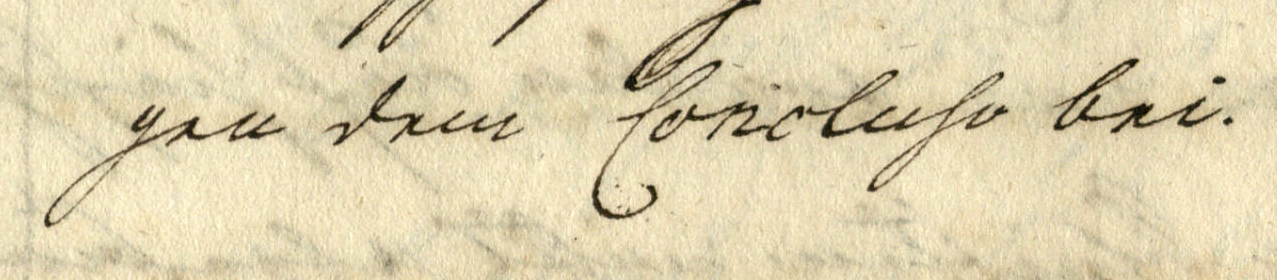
gen dem Concluso bei.
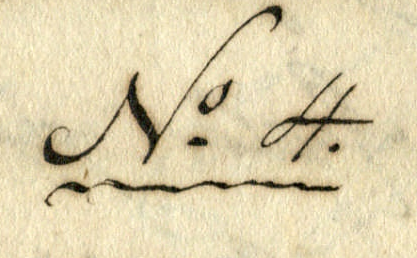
No 4.
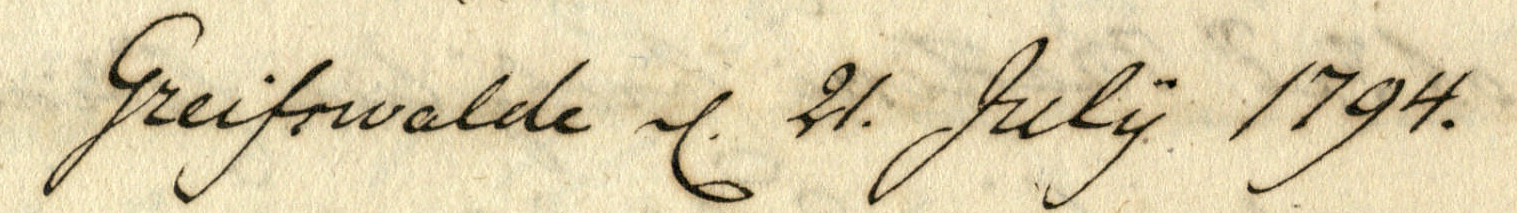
Greifswalde d. 21. July 1794
